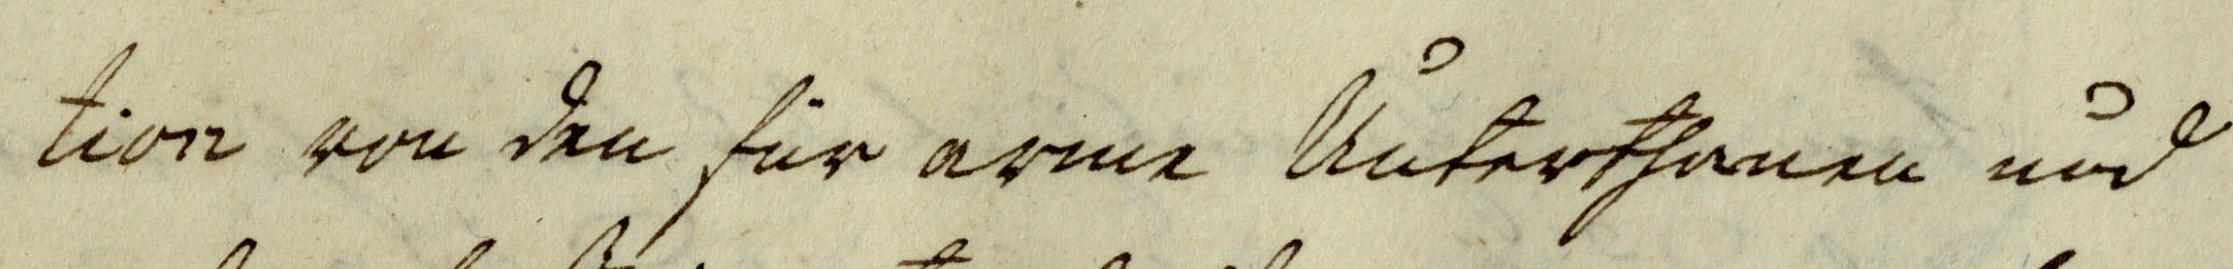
tion von den für arme Unterthanen und
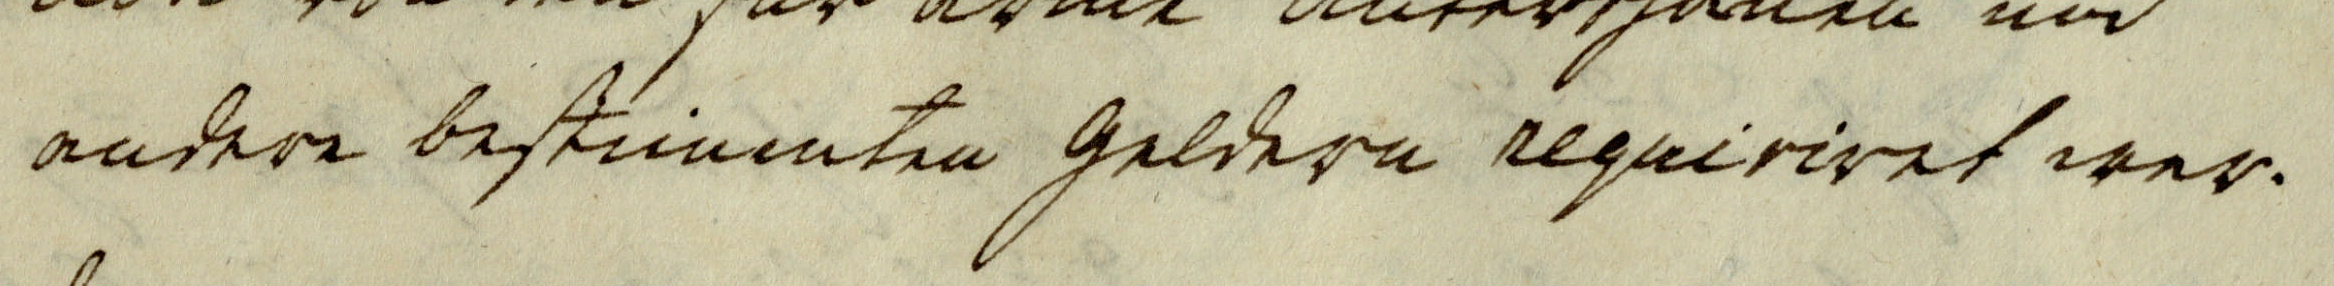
andere bestimmten Geldern requiriret wer¬
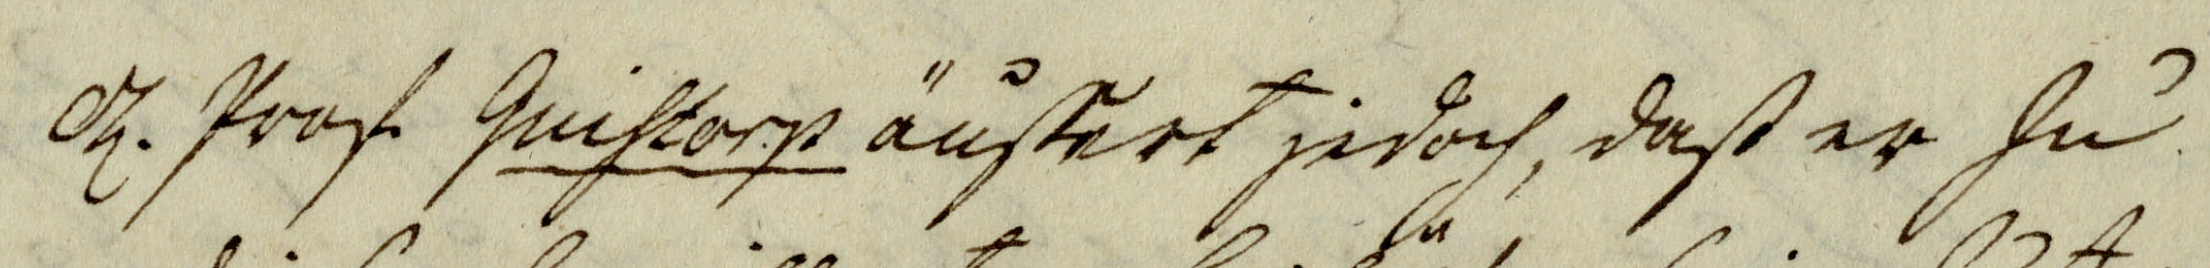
dh. Prof. Quistorp äussert jedoch, daß er zu
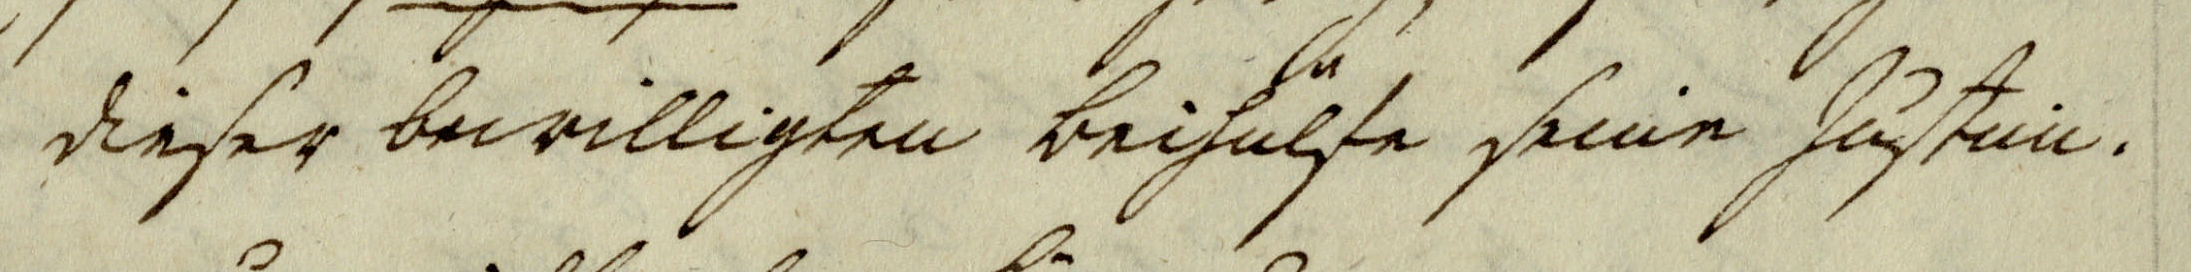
dieser bewilligten Beihülfe seine Zustim¬
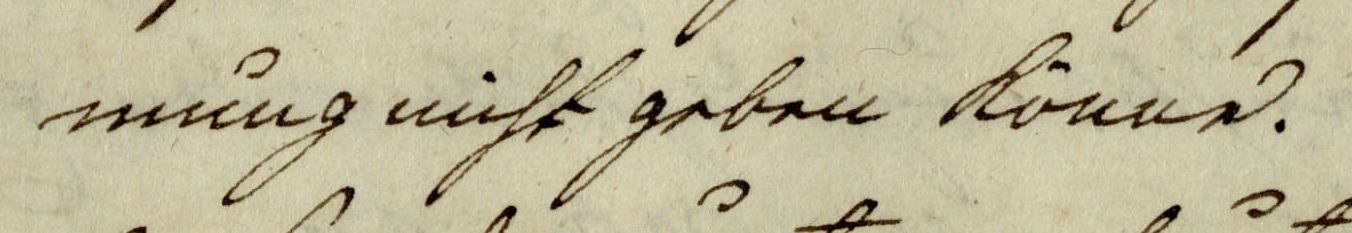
mung nicht geben könne.
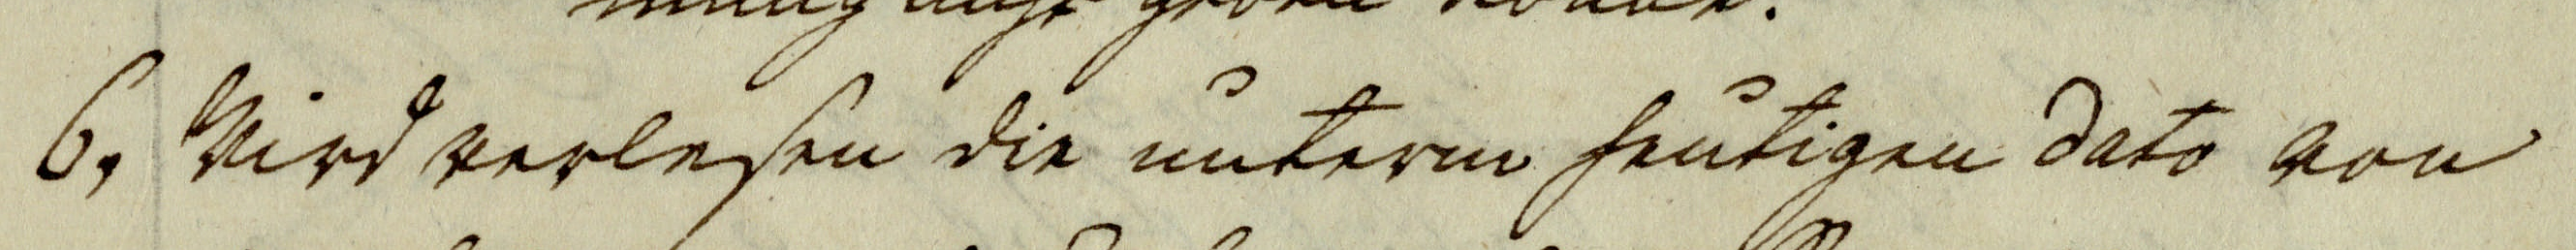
6., Wird verlesen die unterm heutigen dato von
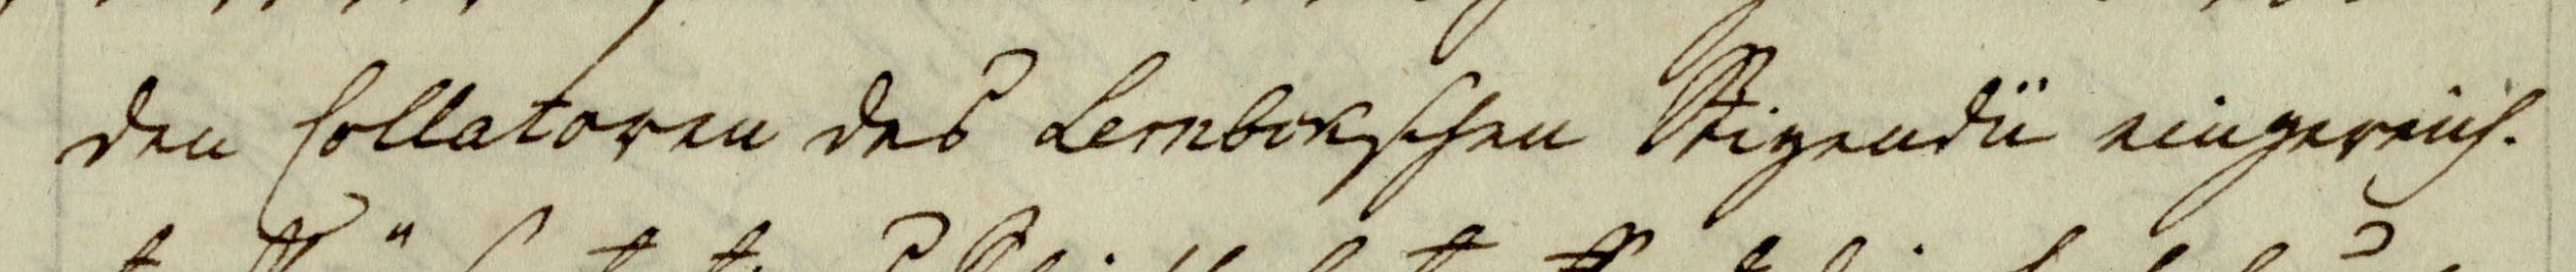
den Collatoren des Lembckschen Stipendii eingereich¬
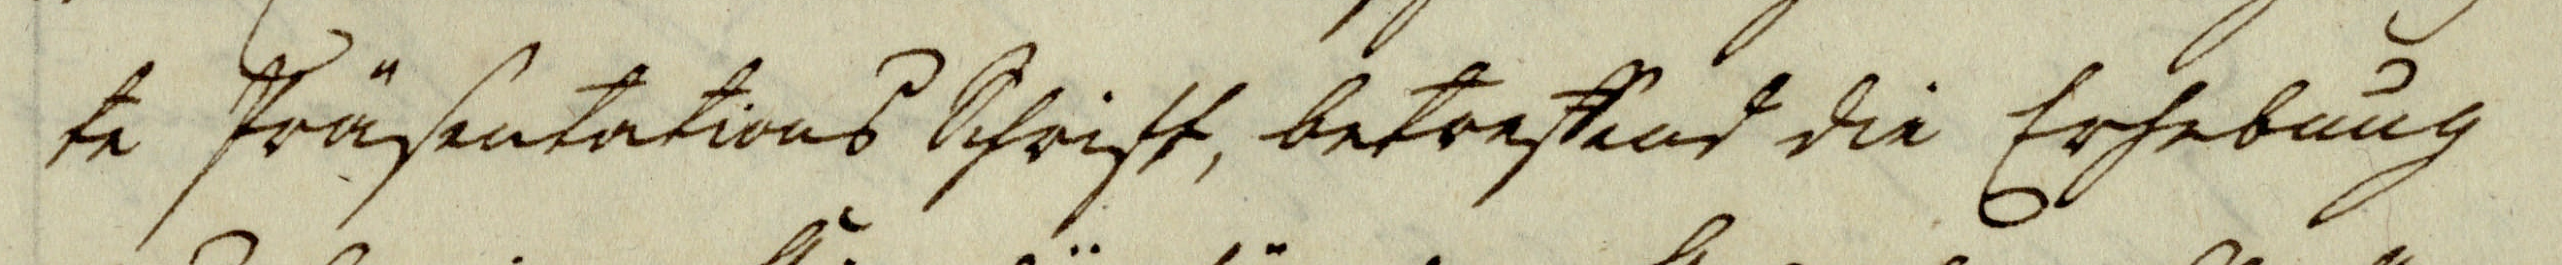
te Präsentations Schrift, betreffend die Erhebung
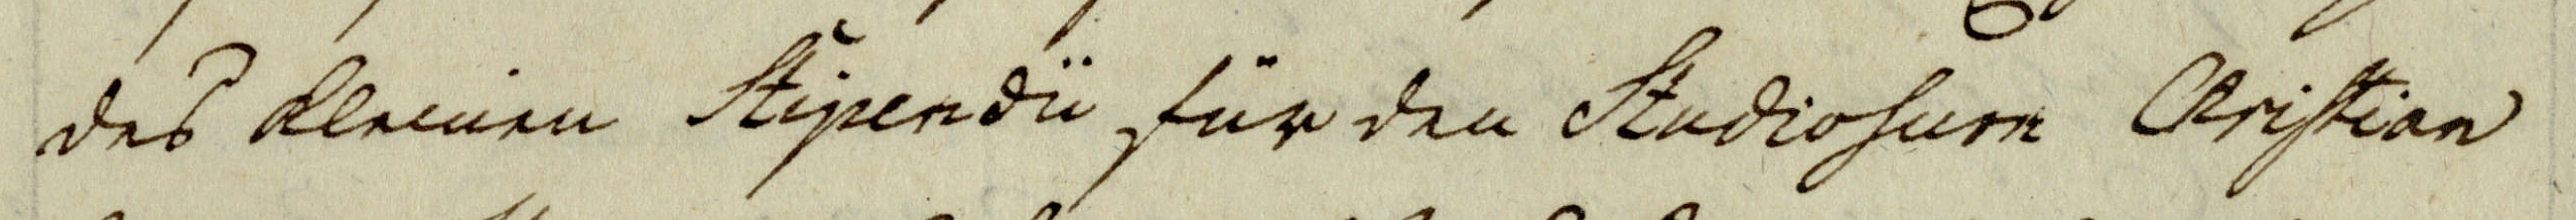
des kleinen Stipendii für den Studiosum Christian
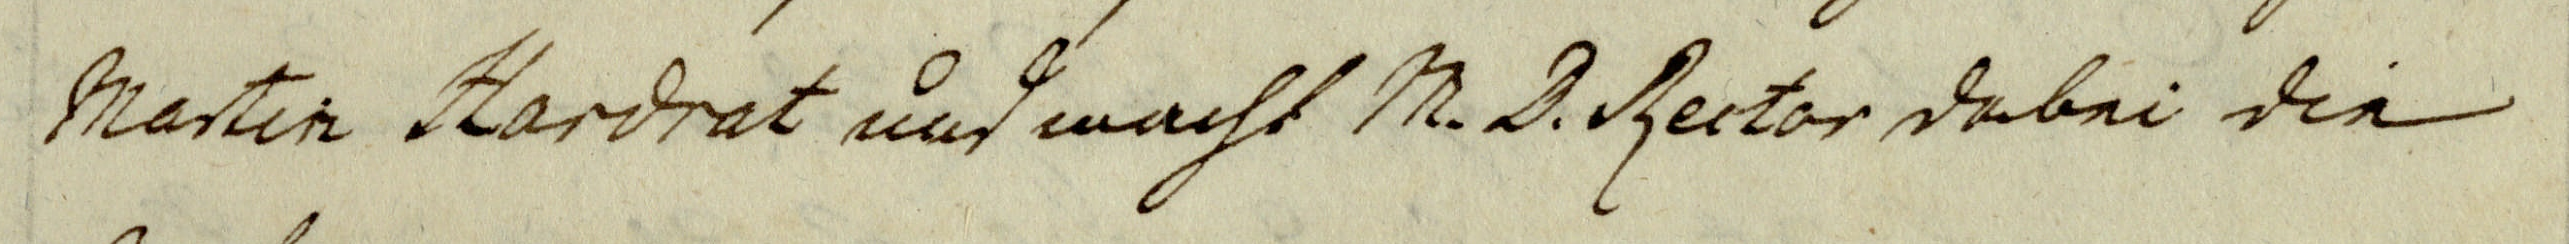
Martin Hardrat und macht M. D. Rector dabei die
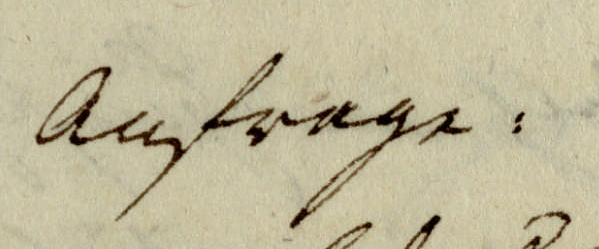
Anfrage:
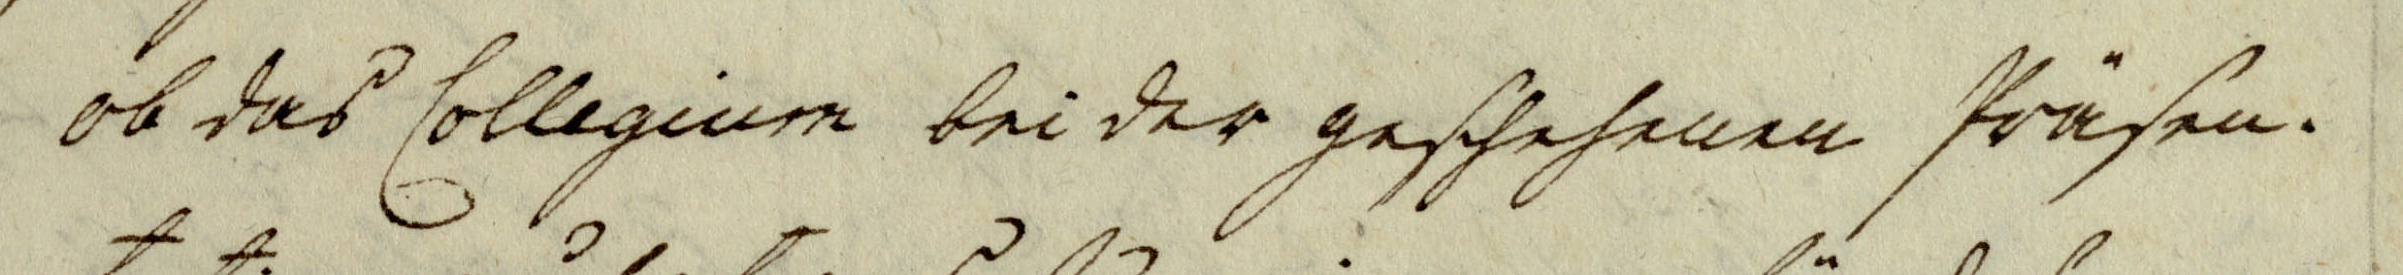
ob das Collegium bei der geschehenen Präsen
